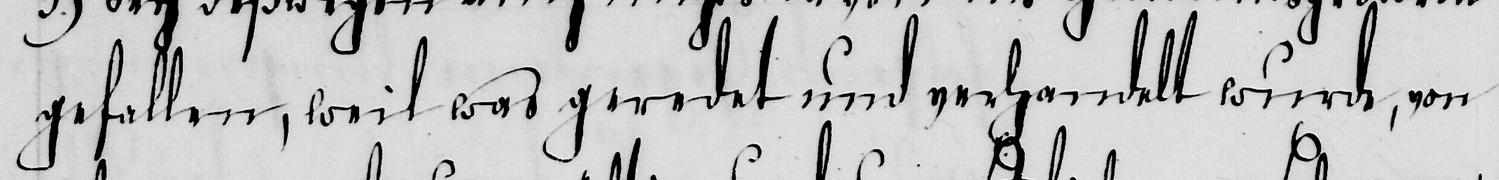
gefallen, weil was geredet und was verhandelt wurde, von
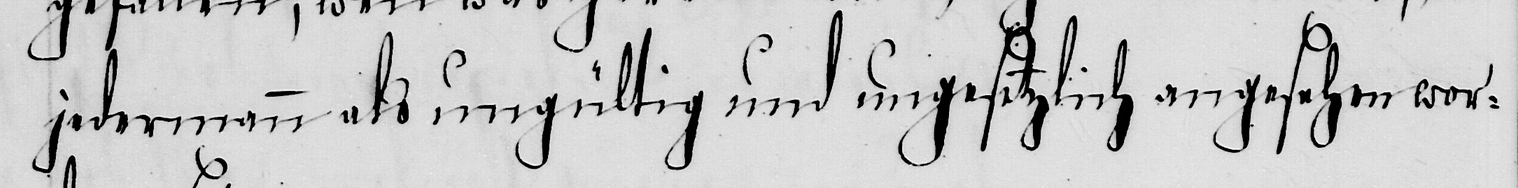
jedermann als ungültig und ungesetzlich angesehen wor¬
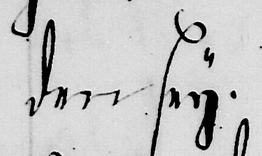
den sey.
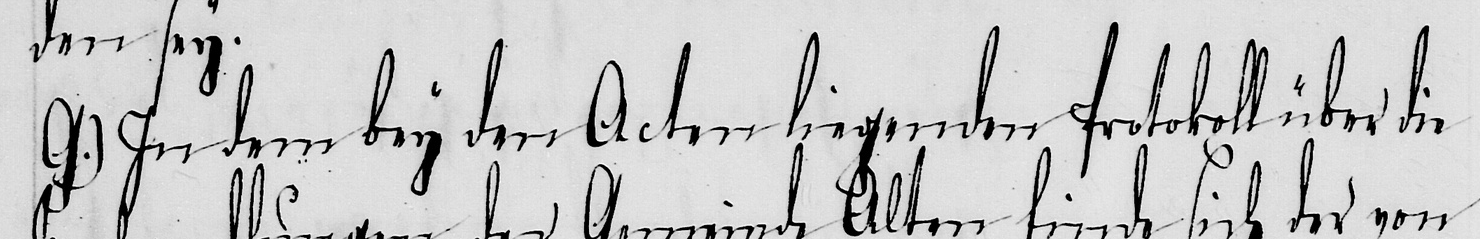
G.) In dem bey den Acten liegenden Protokoll über
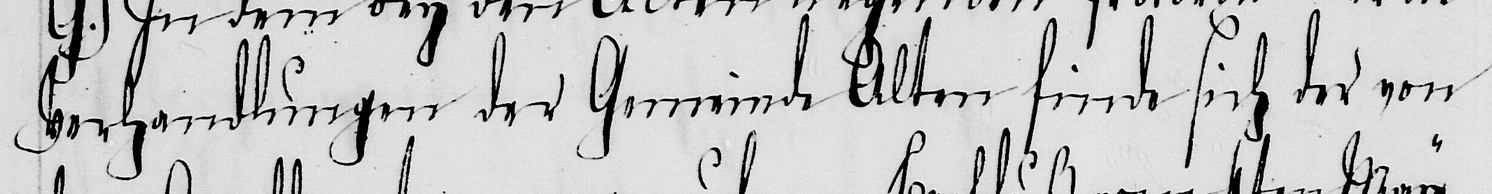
Verhandlungen der Gemeinde Alten finde sich der von
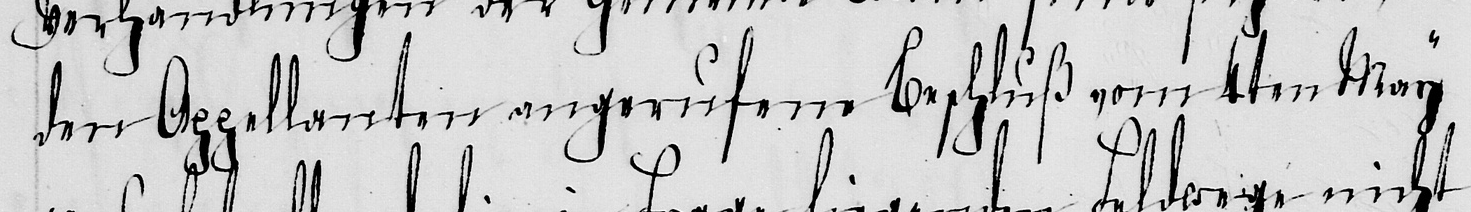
den Appellanten angerufene Beschluß vom 4ten May
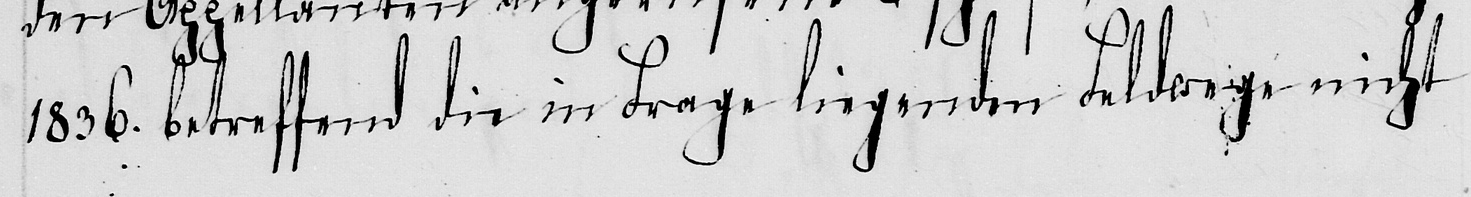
1836. betreffend die in Frage liegenden Feldwege nicht
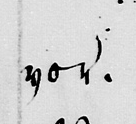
vor.
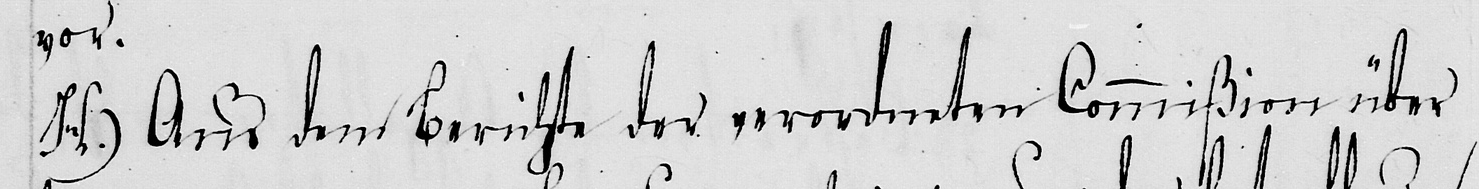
H.) Aus dem Berichte der verordneten Commißion über
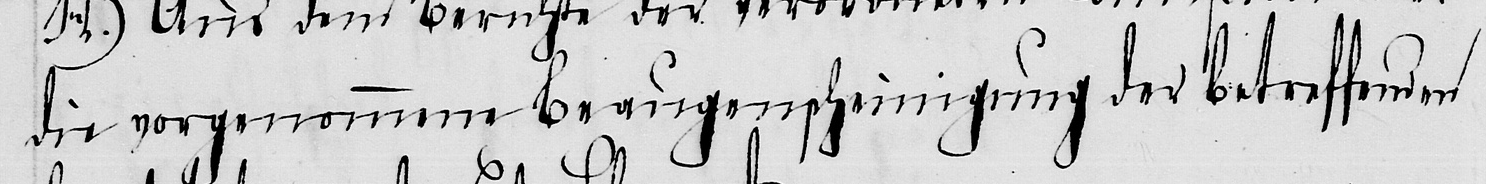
die vorgenommene Beaugenscheinigung der betreffenden
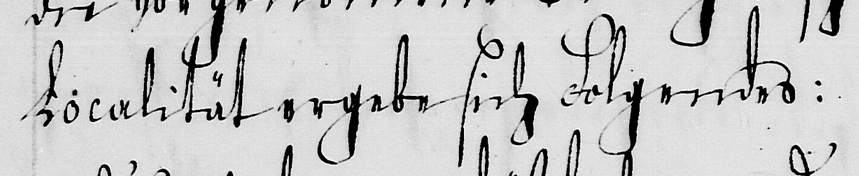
Localität ergebe sich Folgendes:
